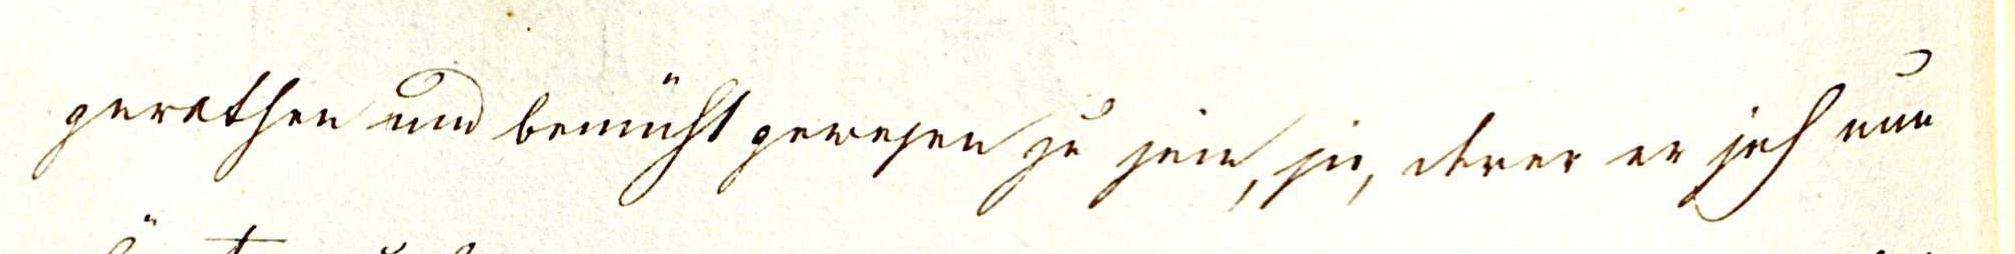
gerathen und bemüht gewesen zu sein, sie, derer er xx nun
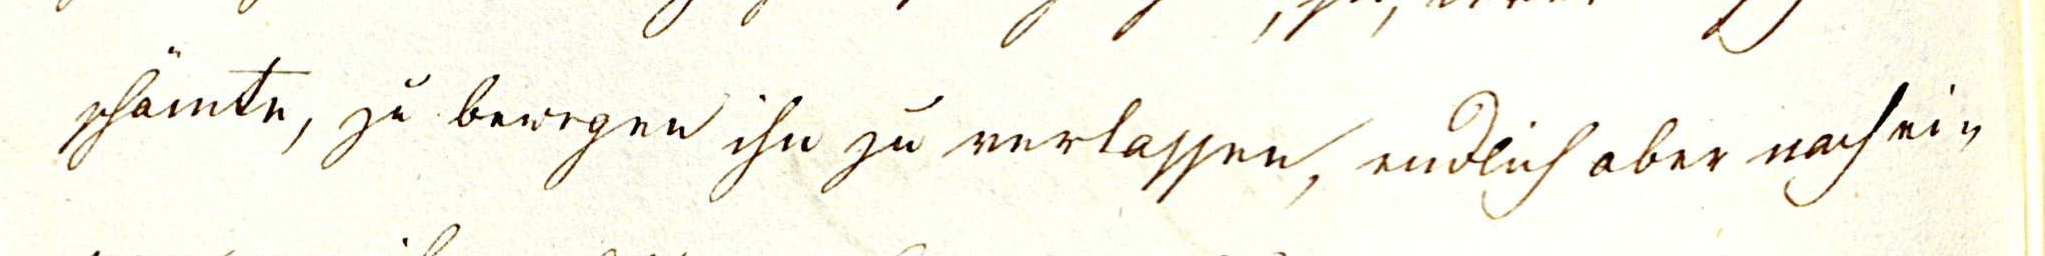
schämte, zu bewegen ihn zu verlassen, endlich aber nach ei¬
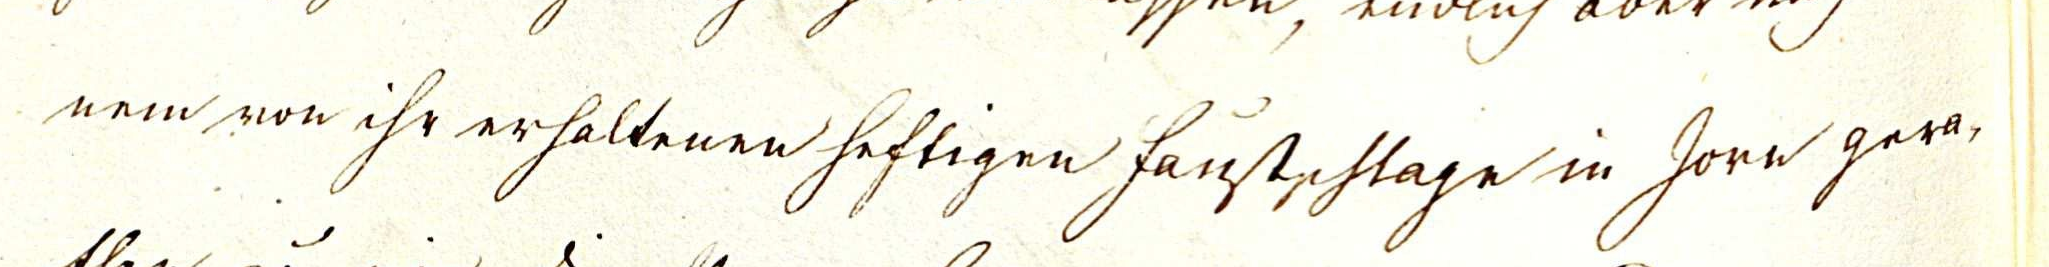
nem von ihr erhaltenen heftigen Hauxxschlage in Jorn gera¬
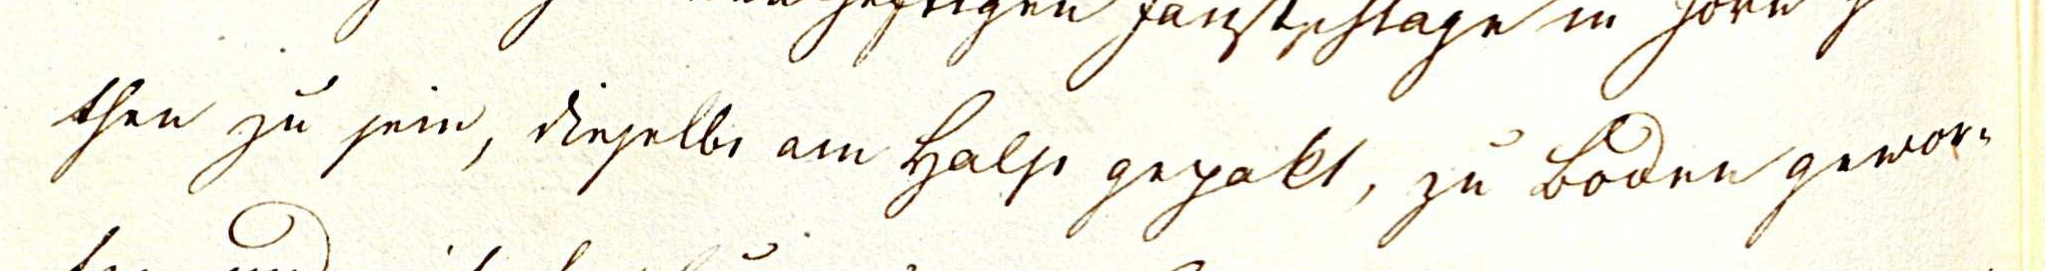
then zu sein, dieselbe am Halse gepakt, zu Boden gewor¬
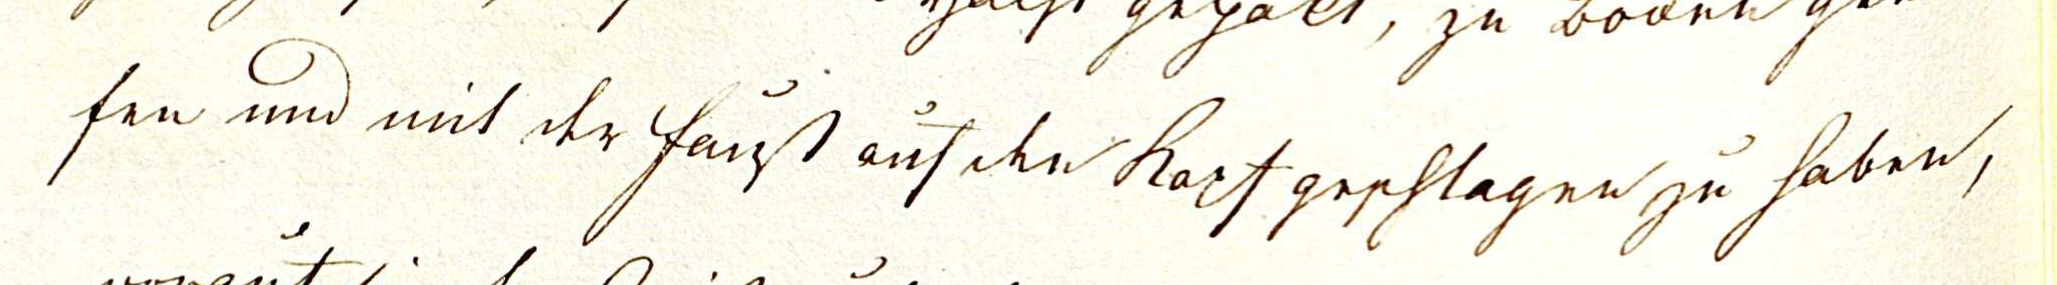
fen und mit der Haust auf den Kopf geschlagen zu haben,
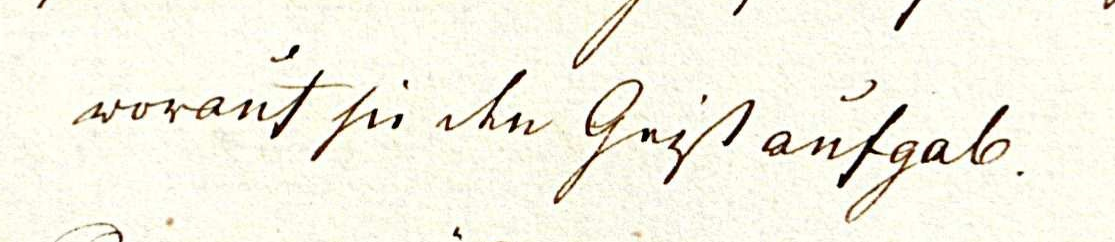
worauf sie den Geist aufgab.
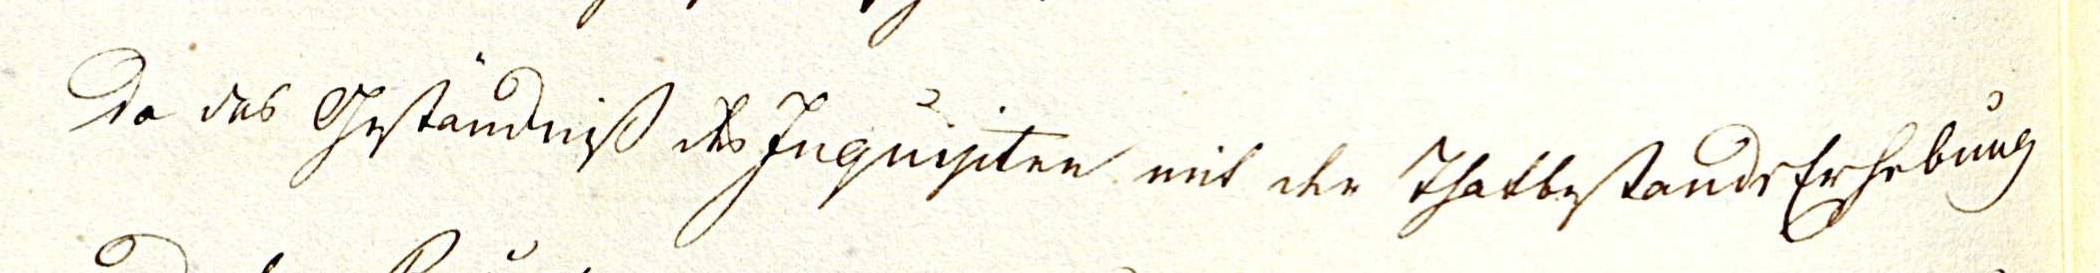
Da das Geständniß des Jnquisiten mit der Thatbestands Erhebung
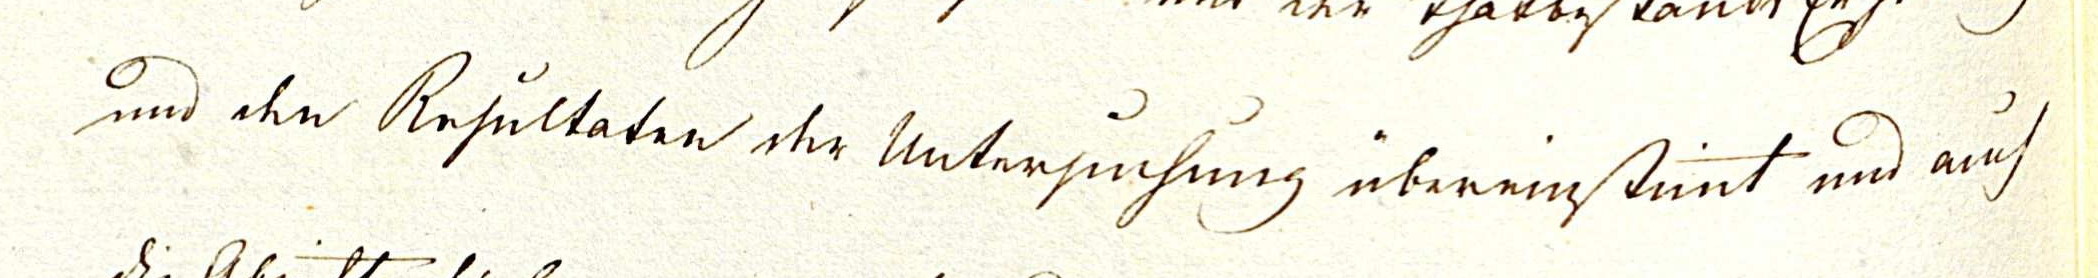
und den Resultten der Untersuchung übereinstimmt und auch
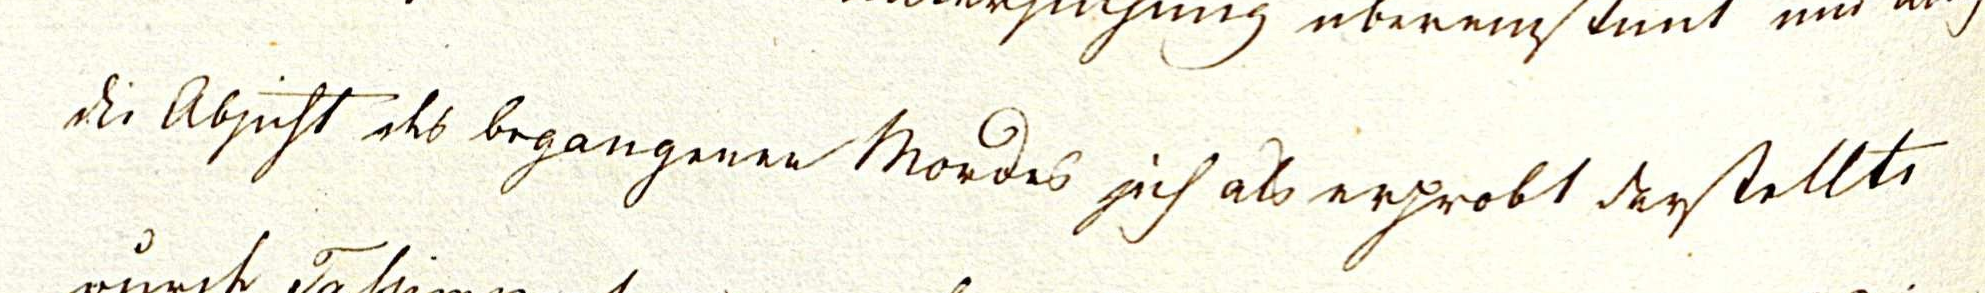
die Absicht des begangenen Mordes sich als erprobt darstellte
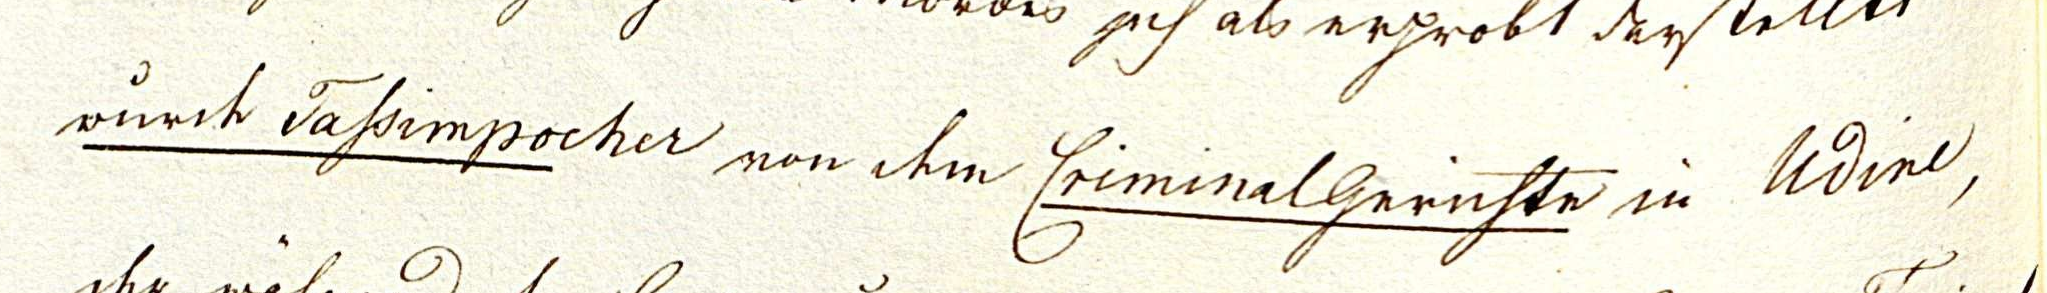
wurde Tassimpocher von dem Criminal Gerichte in Udine,
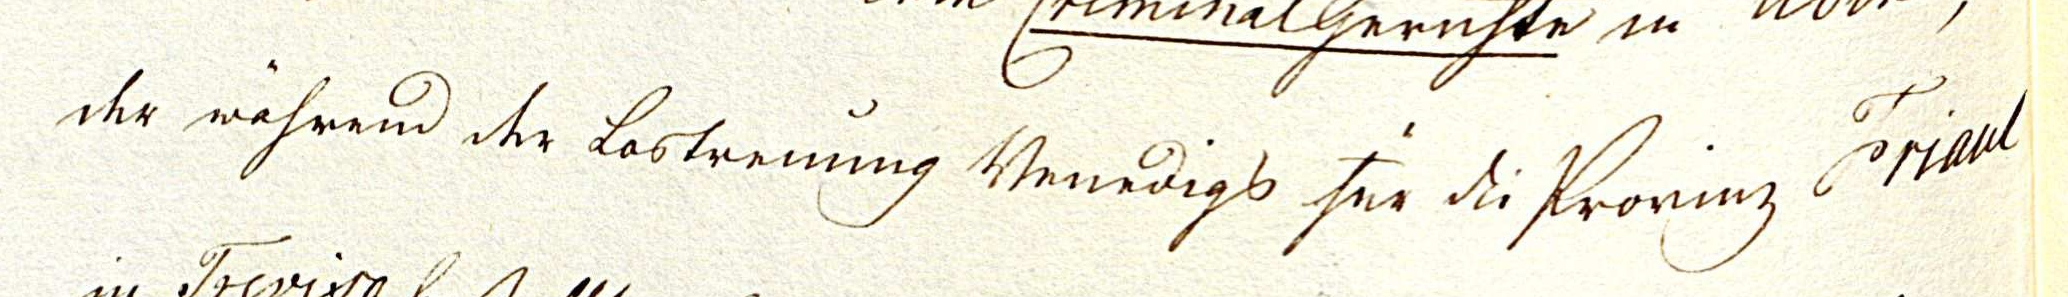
der während der Lostrenung Venedigs für die Provinz Friaul
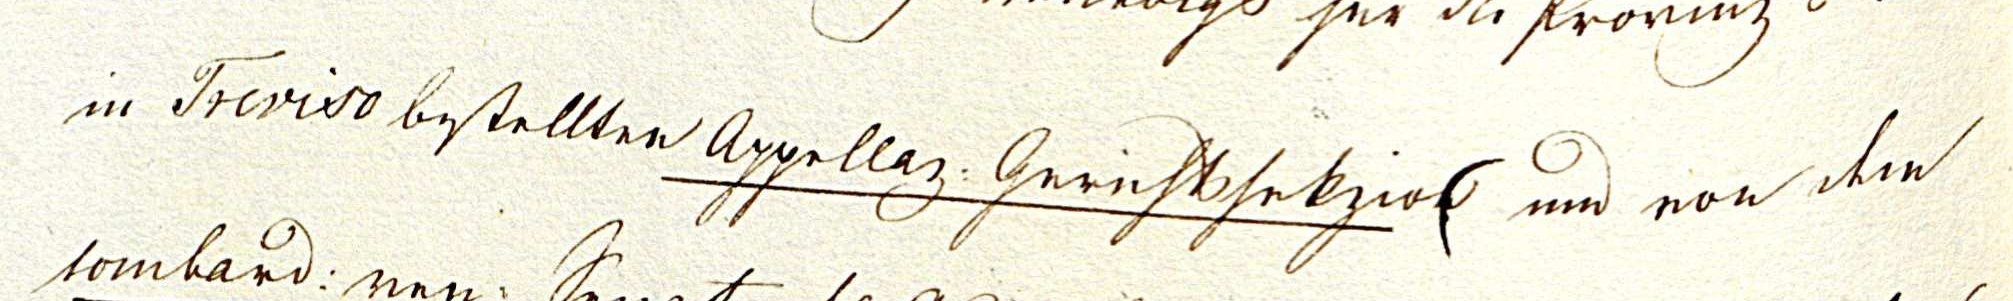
in Treviso bestellten Appellaz: Gerichtssekzion und von dem
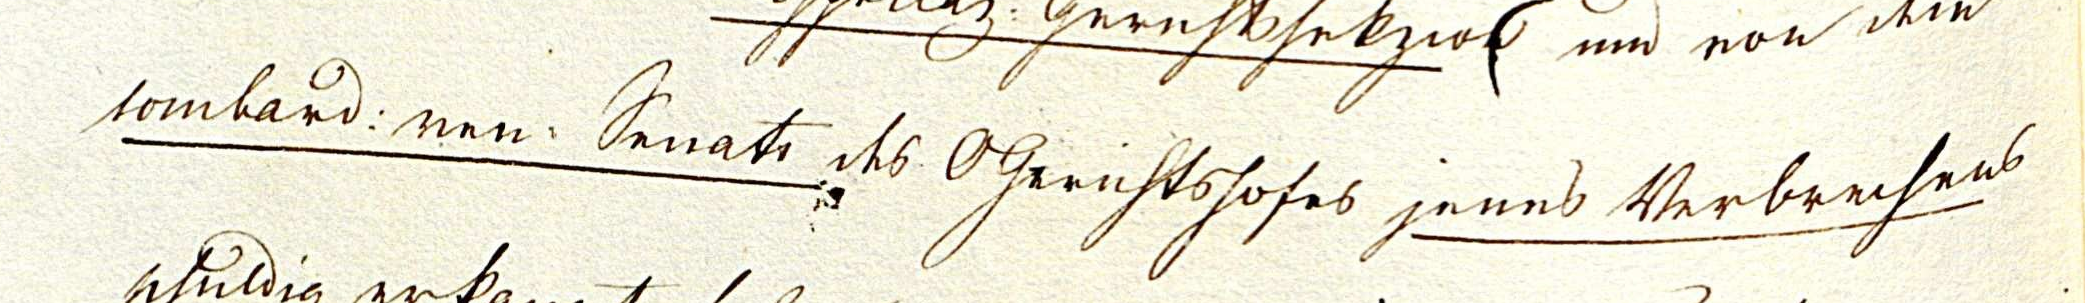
tombard. ren: Senate des Gerichtshofes jenes Verbrechens
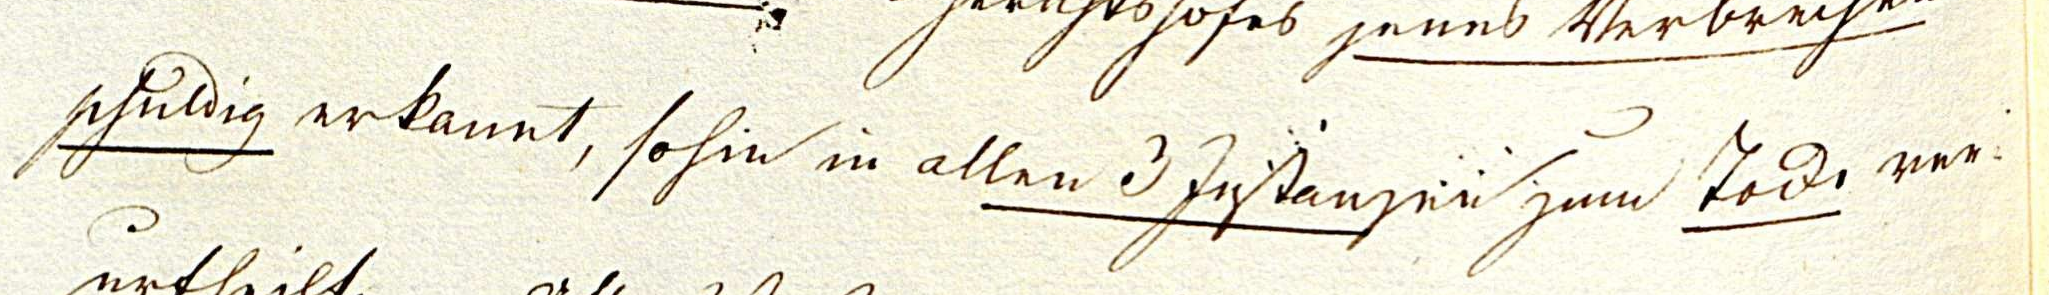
schuldig erkannt, sohin in allen 3 Jnstanzen zum Tode ver¬
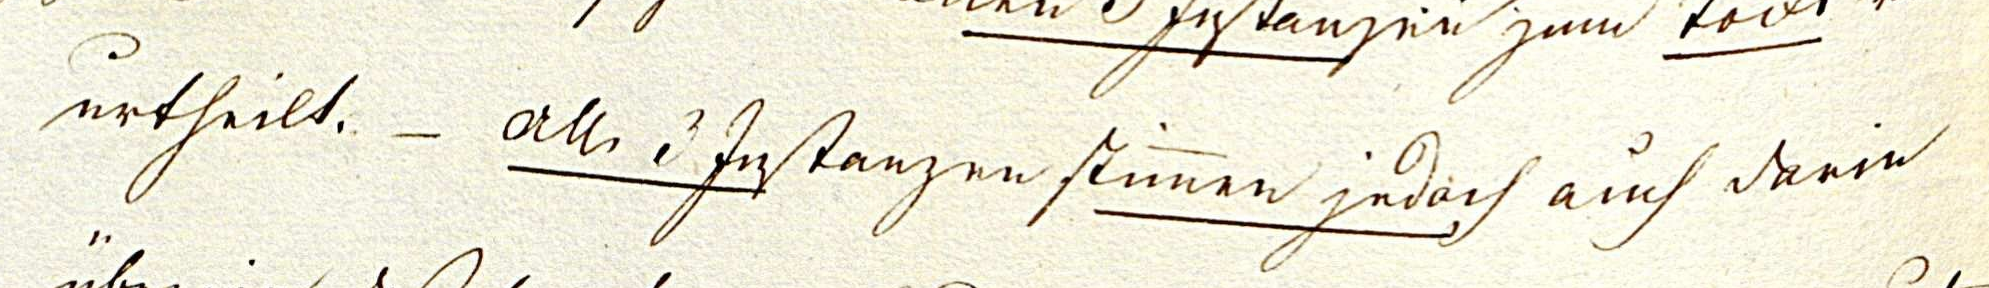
urtheilt.- Alle 3 Jnstanzen stimmen jedoch auch darin
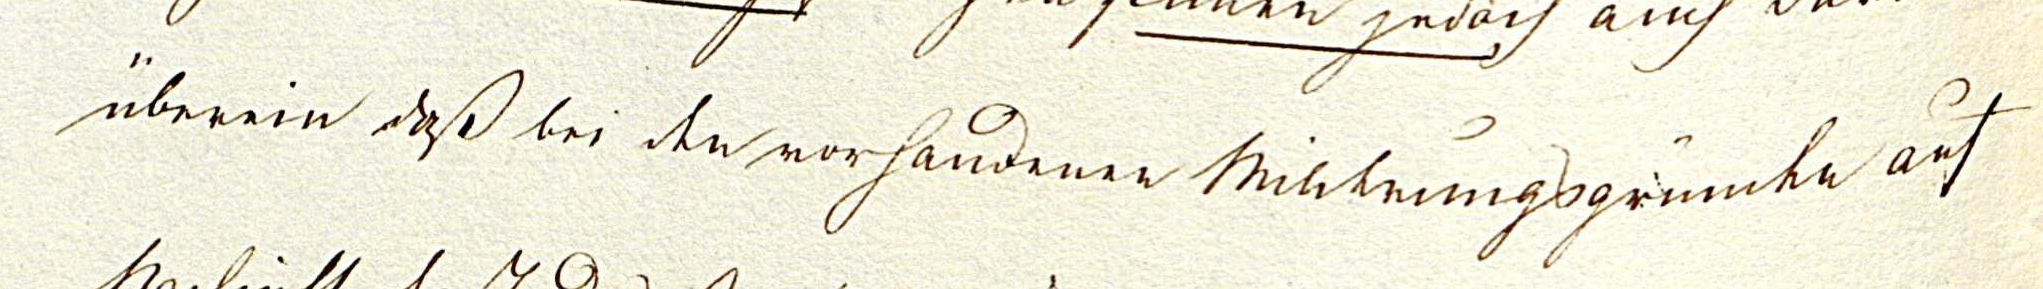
überein daß bei den vorhandenen Milderungsgründen auf
